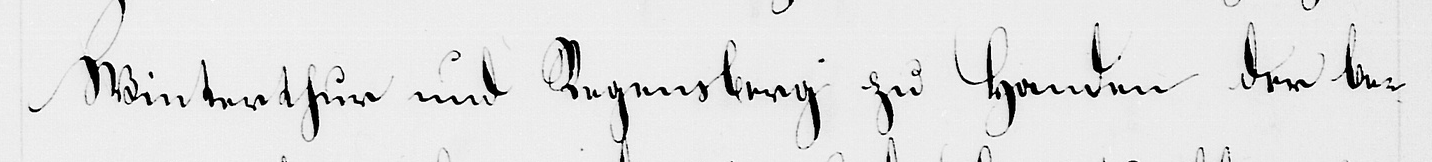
Winterthur und Regensberg zu Handen der be¬
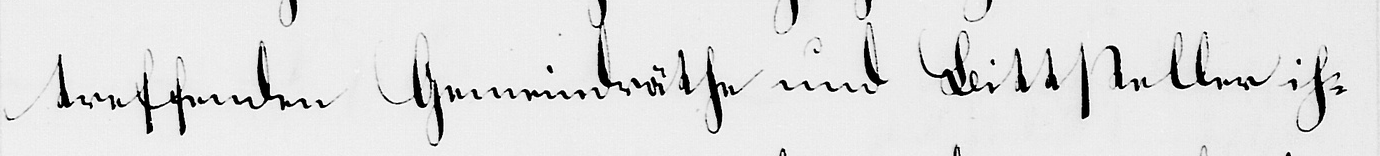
treffenden Gemeindräthe und Bittsteller ih¬
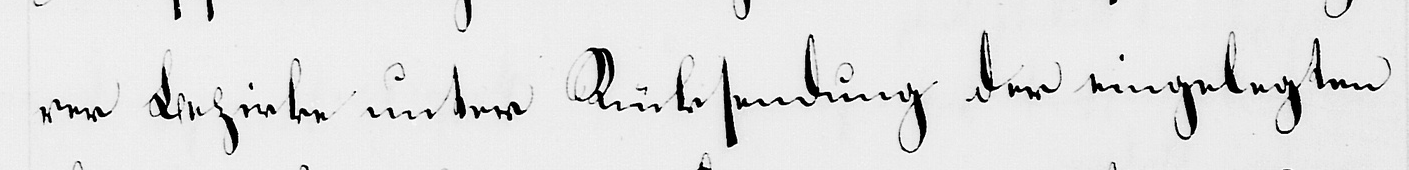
rer Bezirke unter Rücksendung der eingelegten
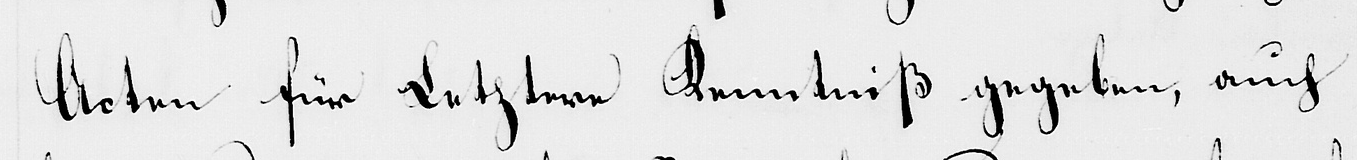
Acten für Letztern Kenntniß gegeben, auch
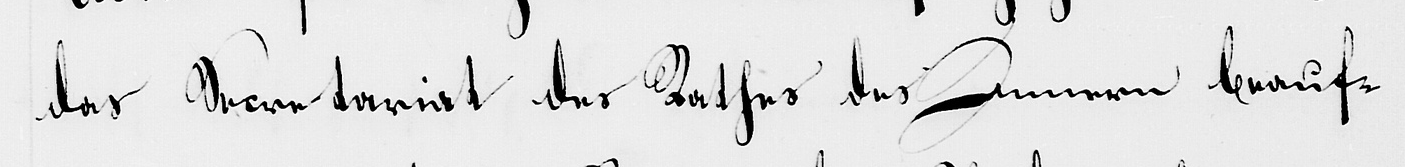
das Secretariat des Rathes des Innern beauf¬
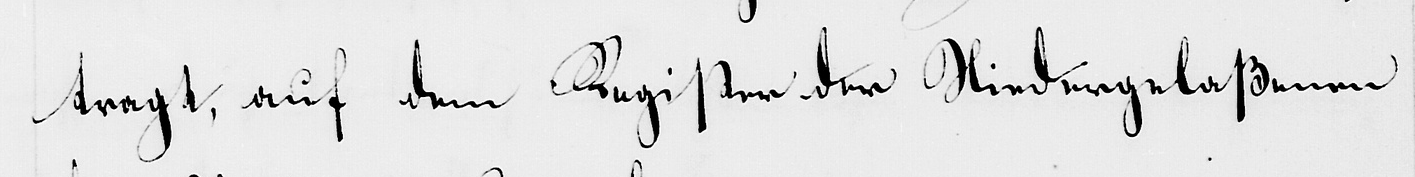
tragt, auf den Register der Niedergelaßenen
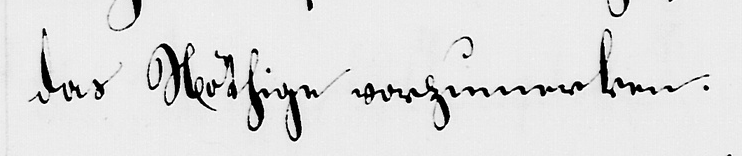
das Nöthige vorzumerken.
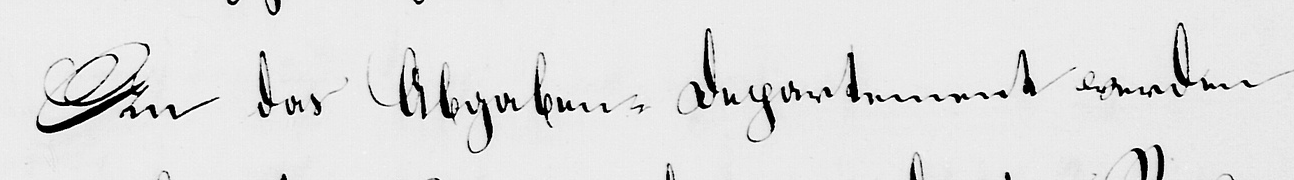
An das Abgaben-Departement werden
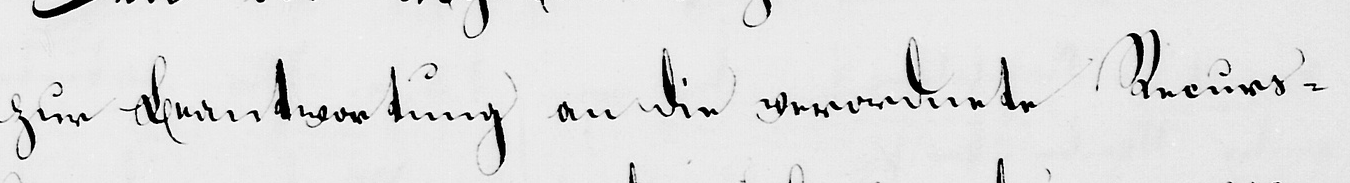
zur Beantwortung an die verordnete Recur¬
